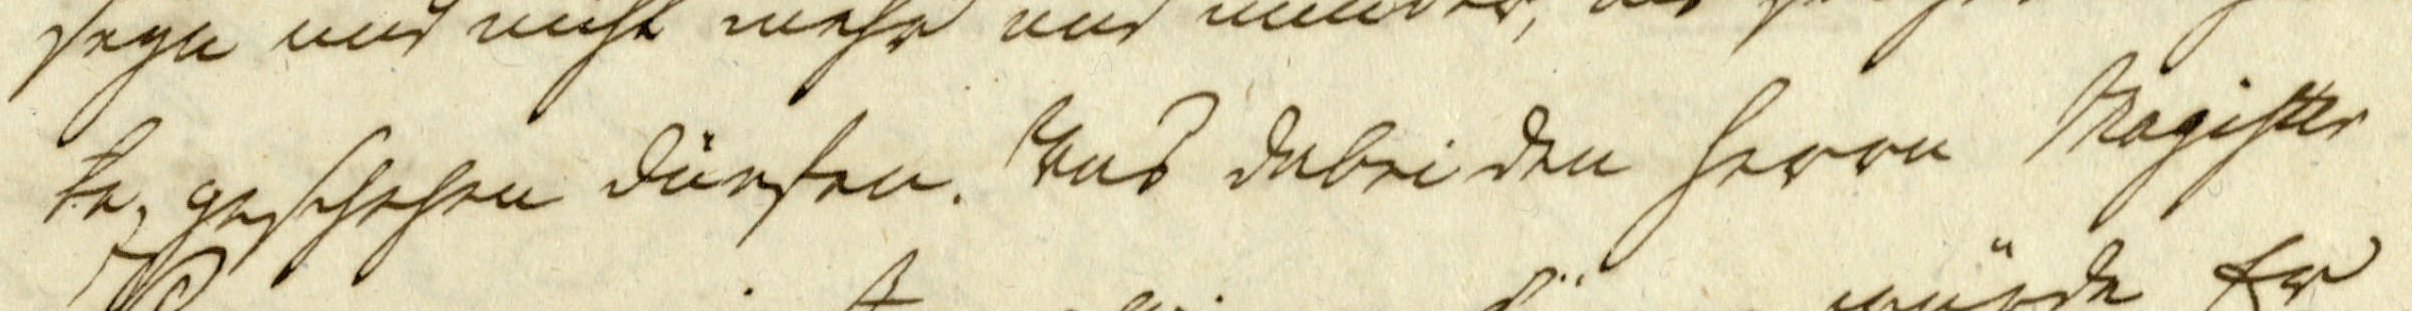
te, geschehen dürfen. Was dabei den herrn Magister
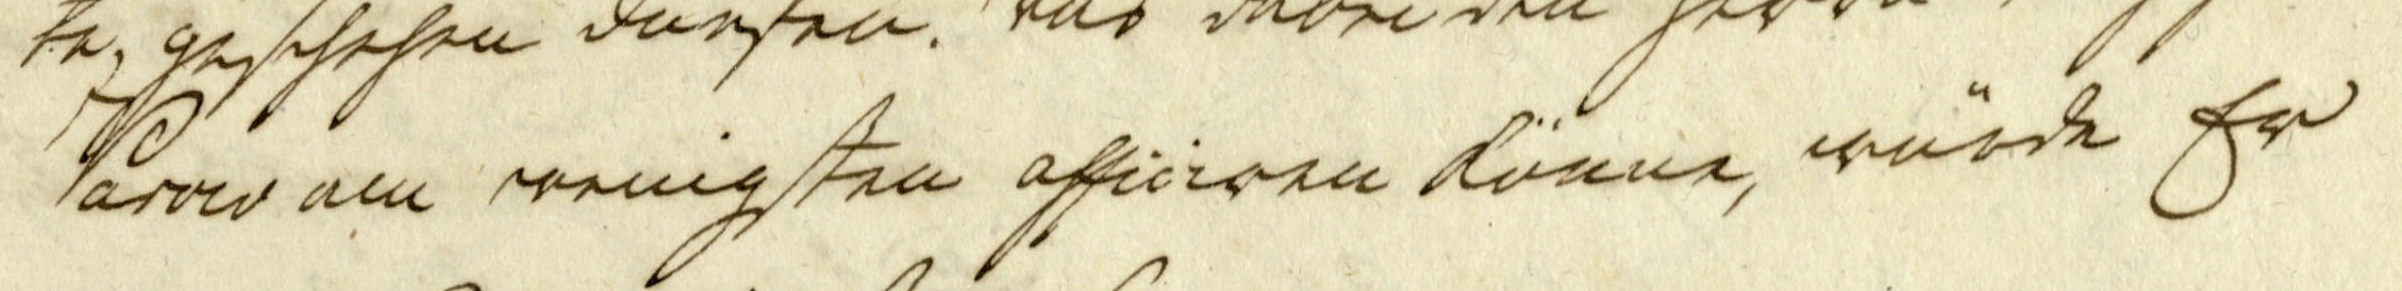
Parow am wenigsten afficiren könne, würde Er
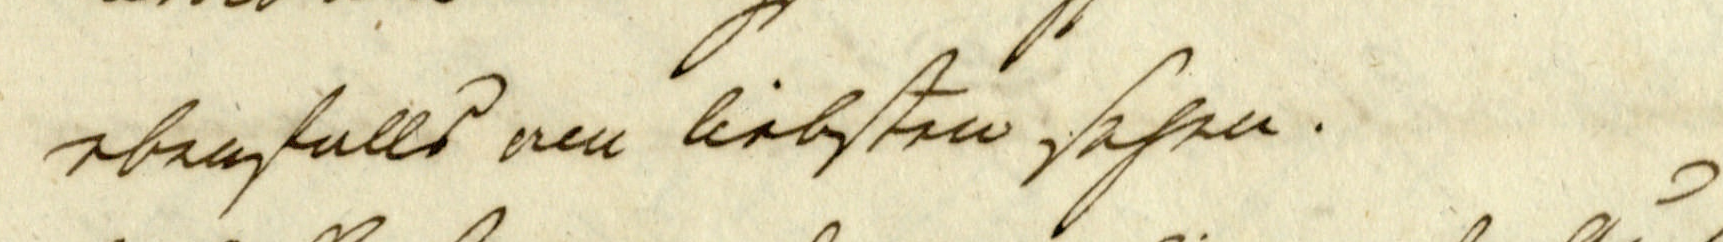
ebenfalls am liebsten sehen.
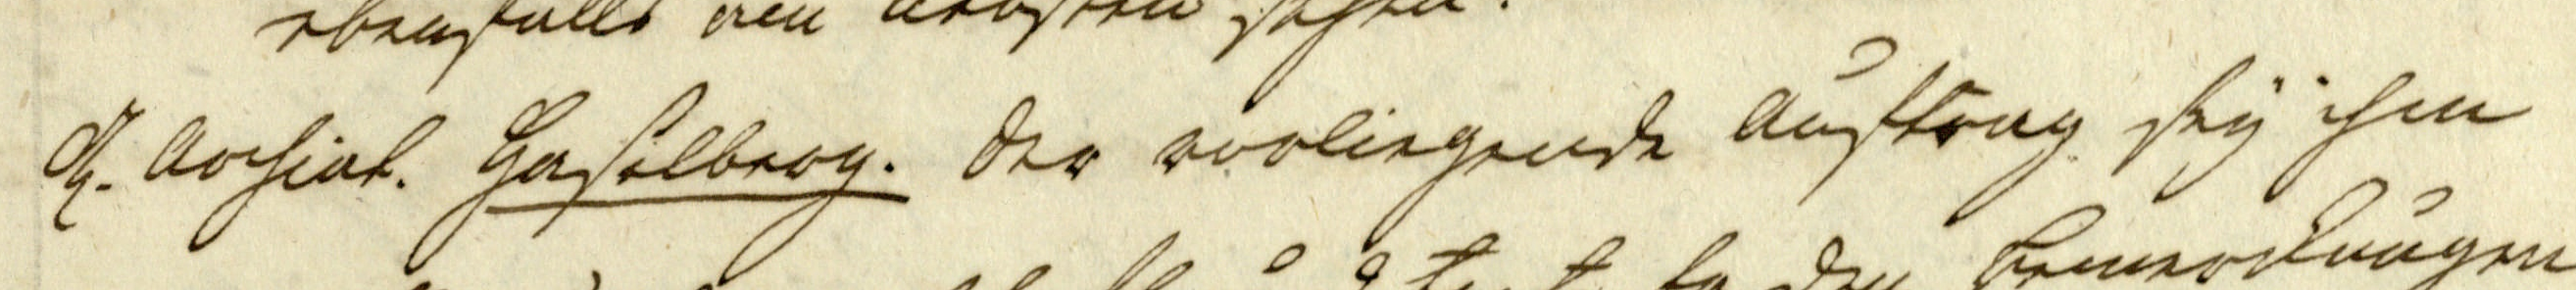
dh. Archiat. Haselberg. der vorliegende Auftrag seÿ ihm
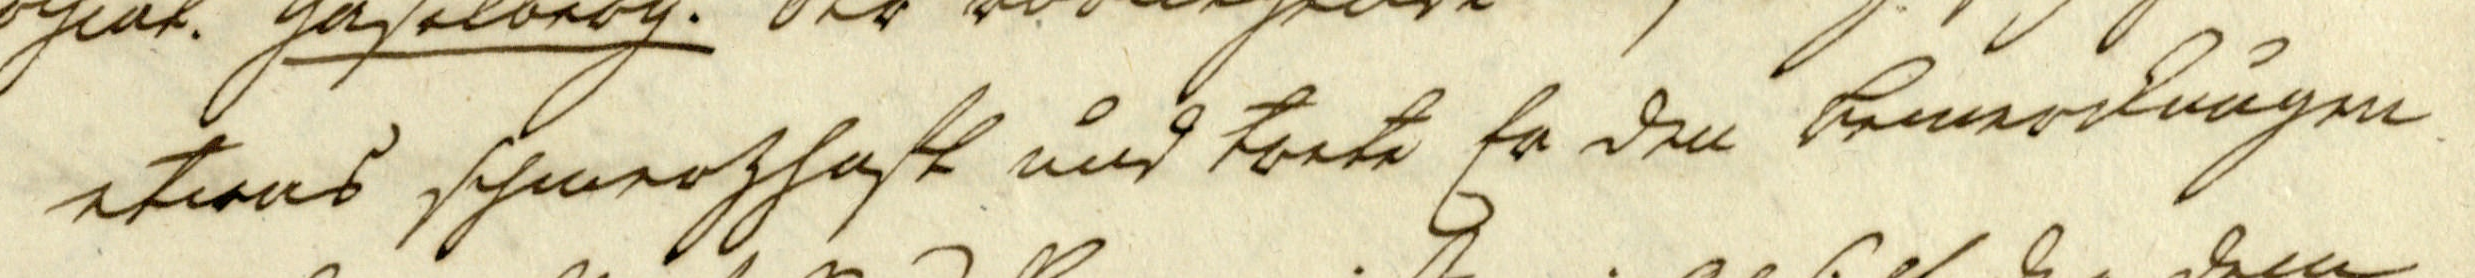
etwas schmerzhaft und trete Er den Bemerckungen
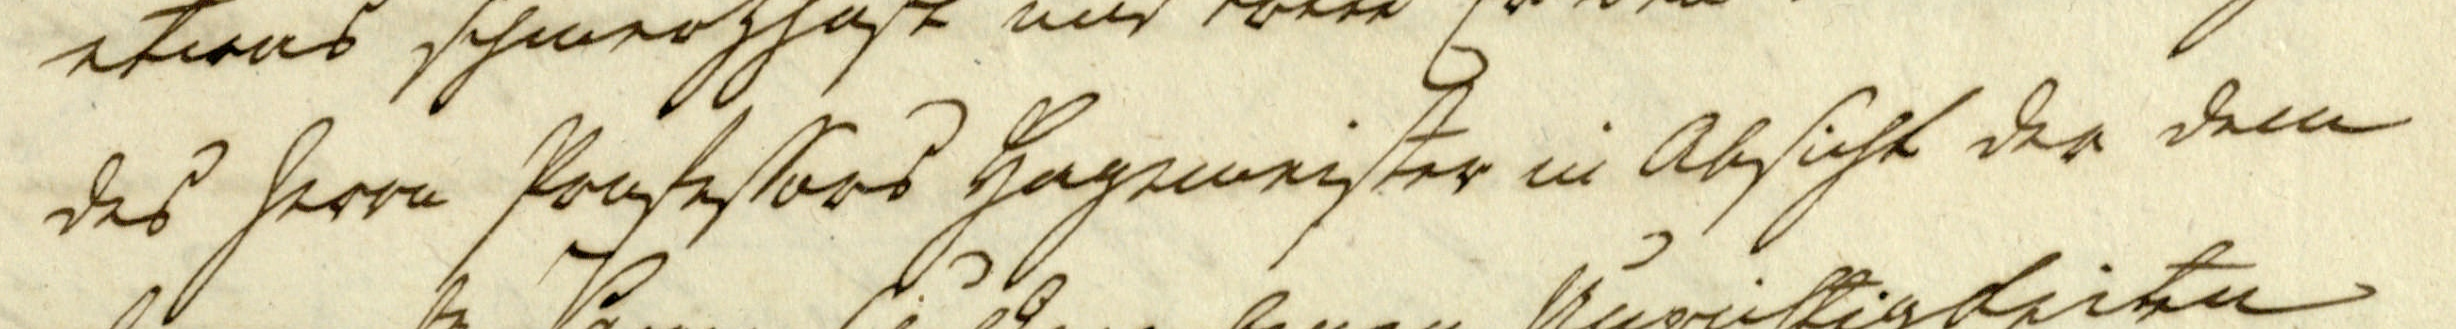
des herrn Professors Hagemeister in Absicht der dem
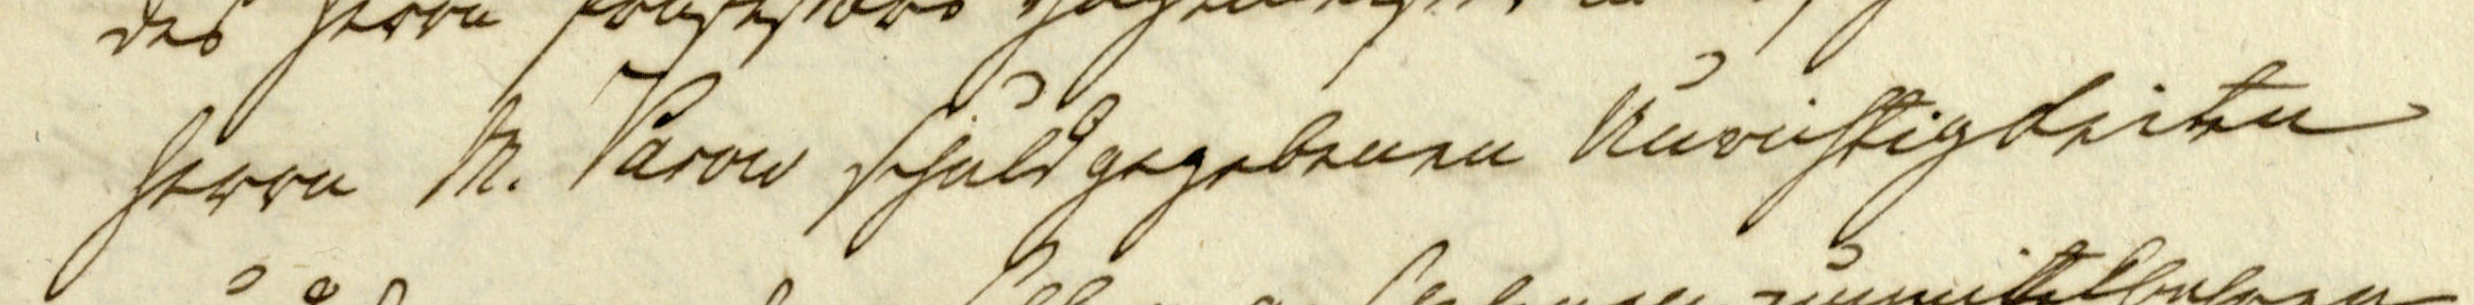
herrn M. Parow schuldgegebenen Unrichtigkeiten
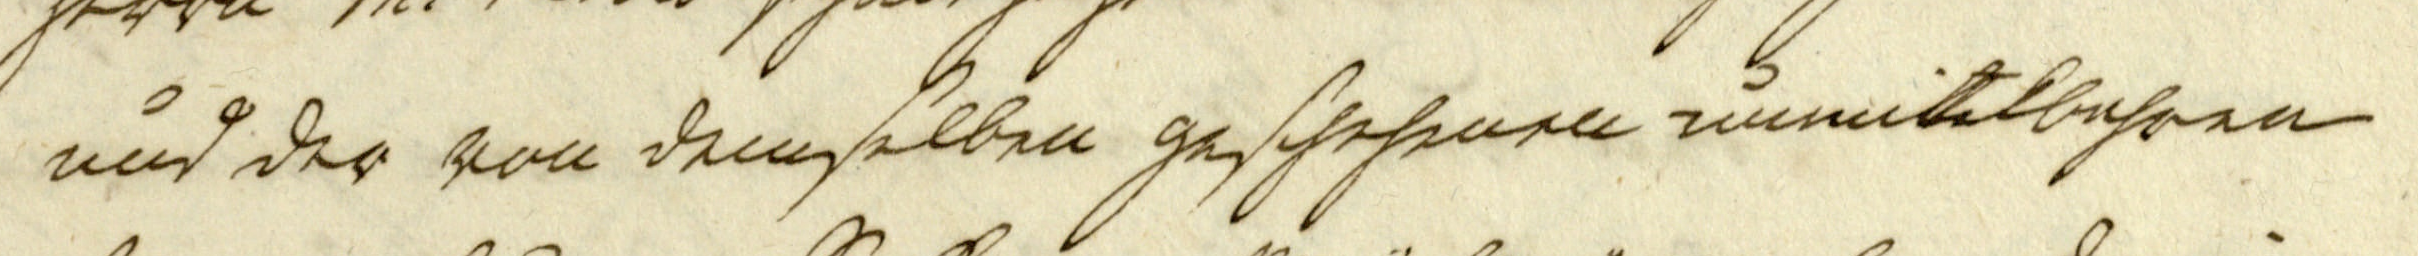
und der von demselben geschehenen unmittelbahren
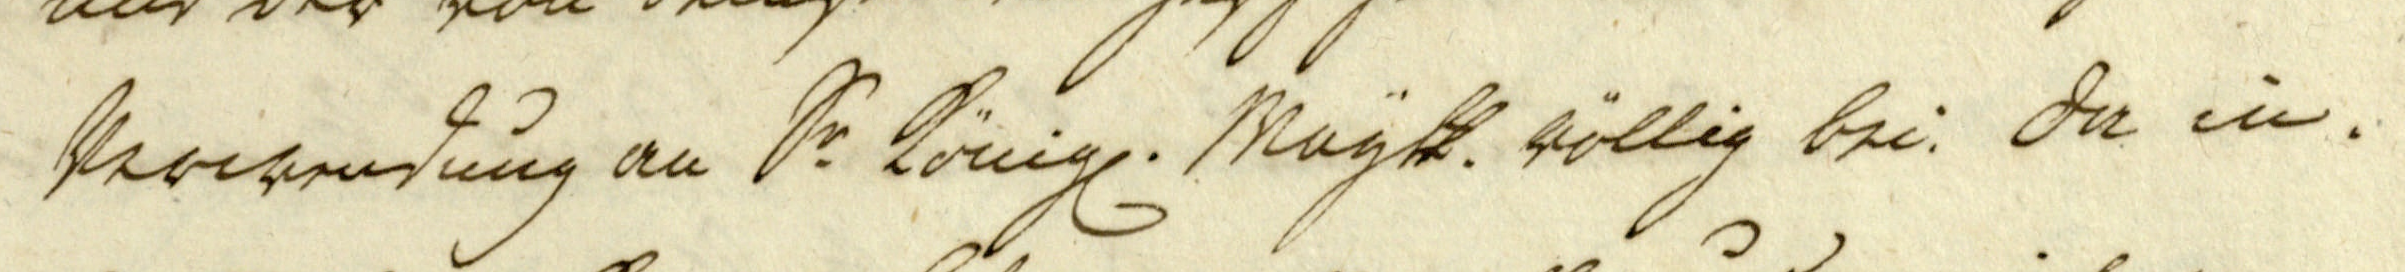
Verwendung an Sr. Königl. Maÿtt. völlig bei. Da in¬
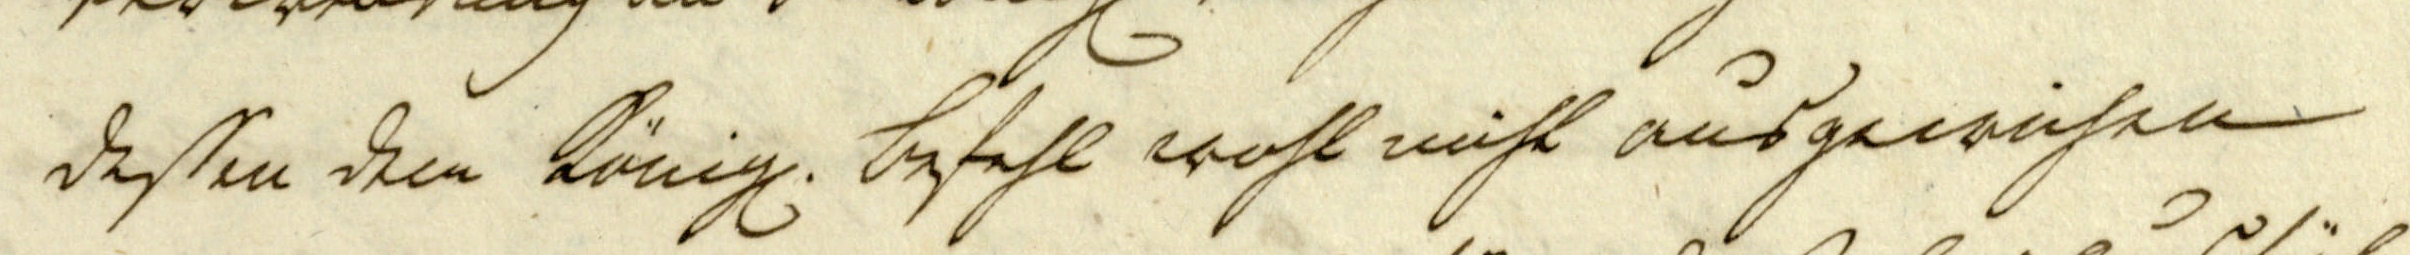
dessen dem Königl. Befehl wohl nicht ausgewichen
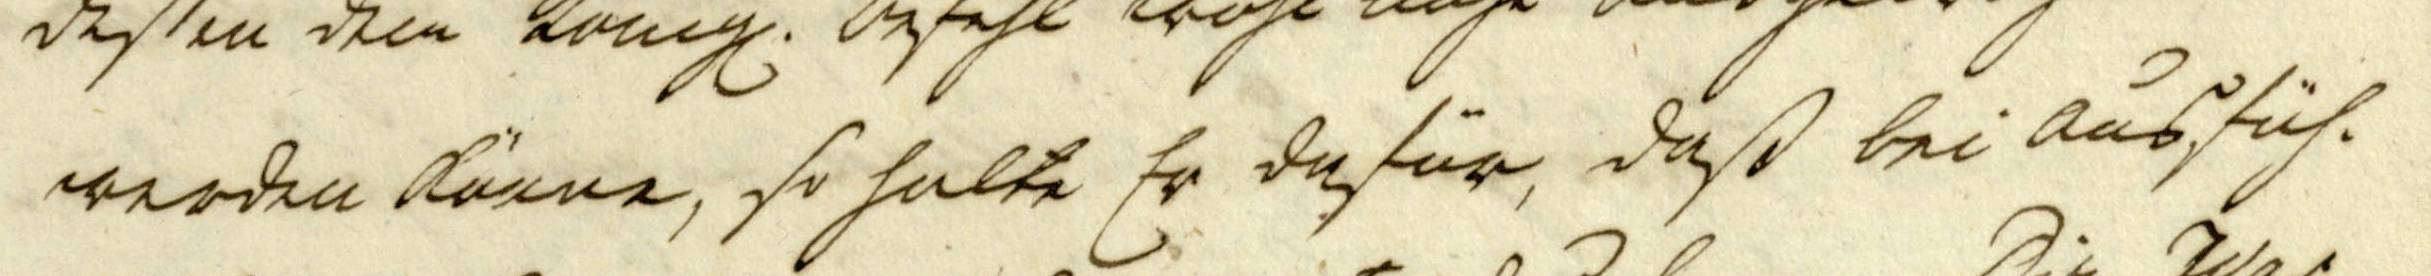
werden könne, so halte Er dafür, daß bei Ausfüh¬
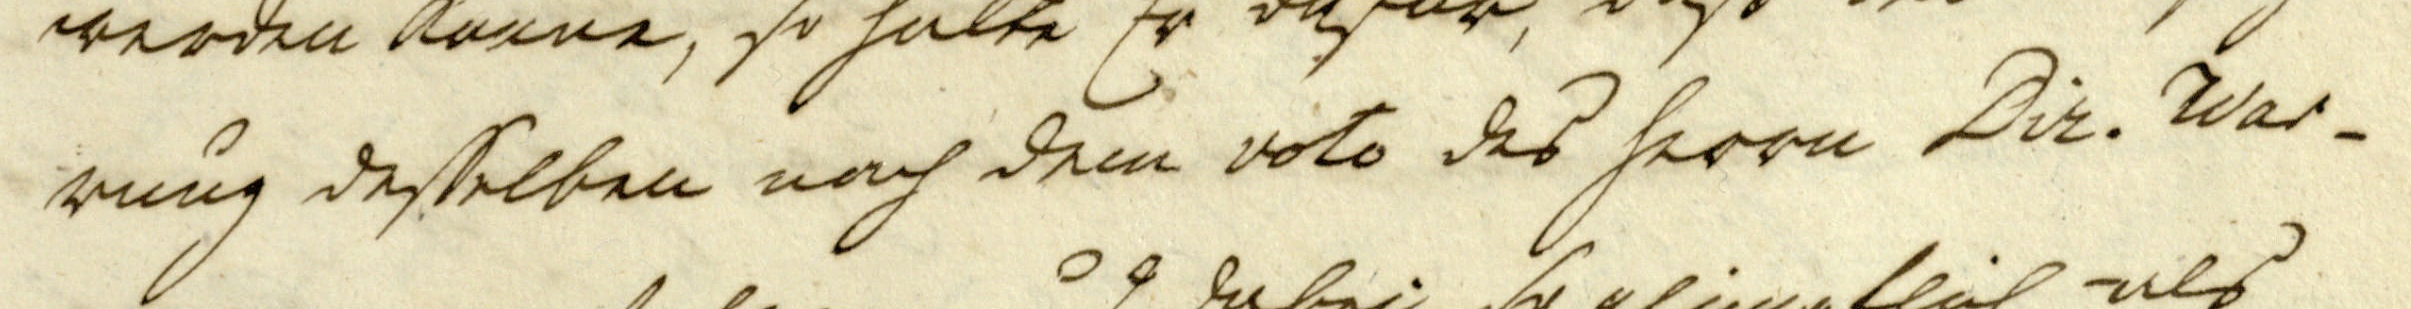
rung desselben nach dem voto des herrn Dir. War¬
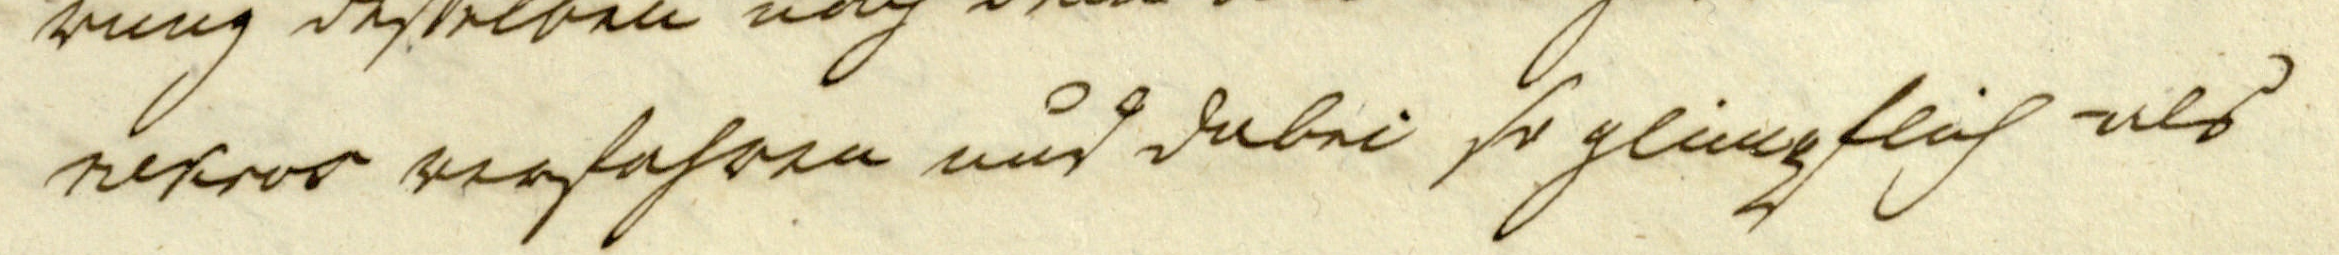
nekros verfahren und dabei so glimpflich als
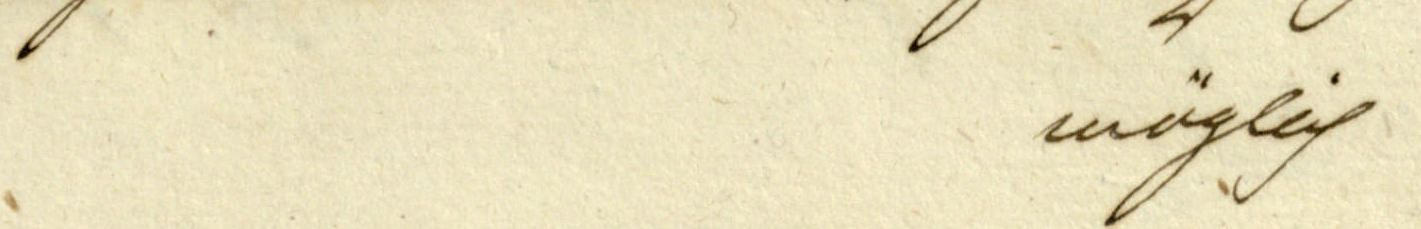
möglich
